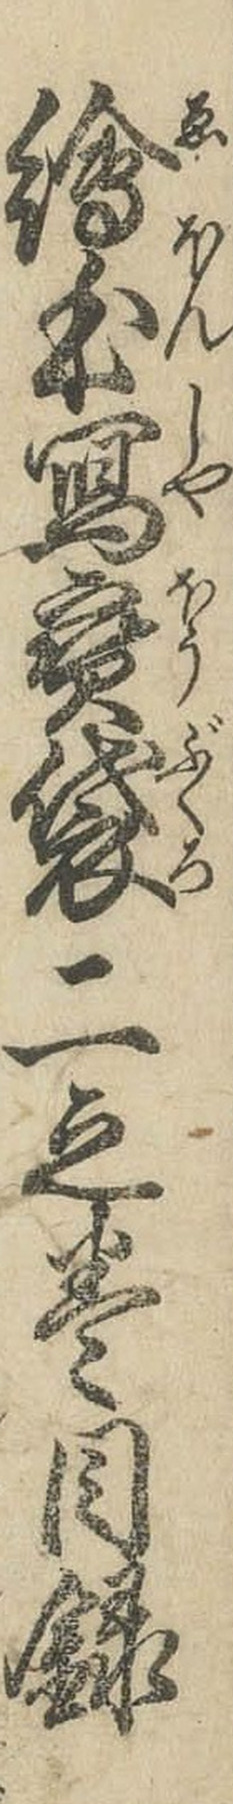絵本写宝袋二之巻目録
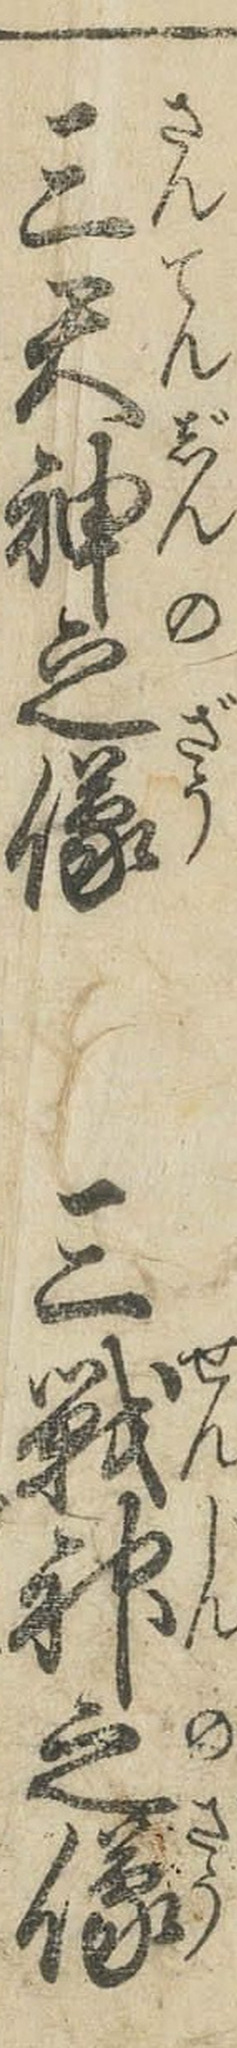三天神之像三戦神之像
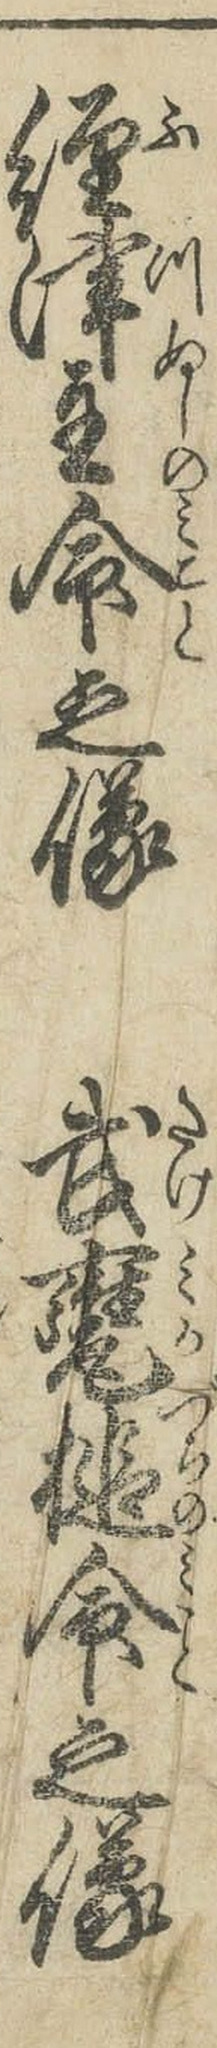経津主命之像武甕槌命之像
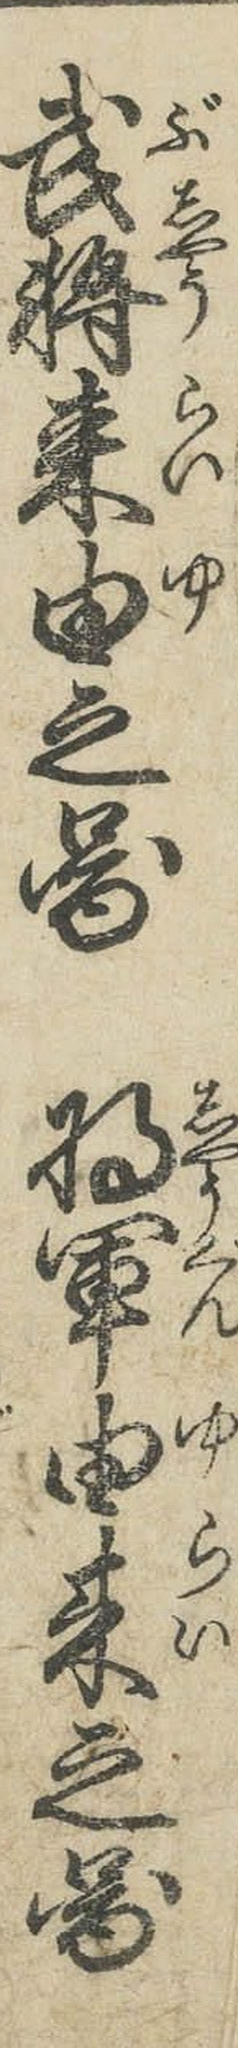武将来由之図将軍由来之図
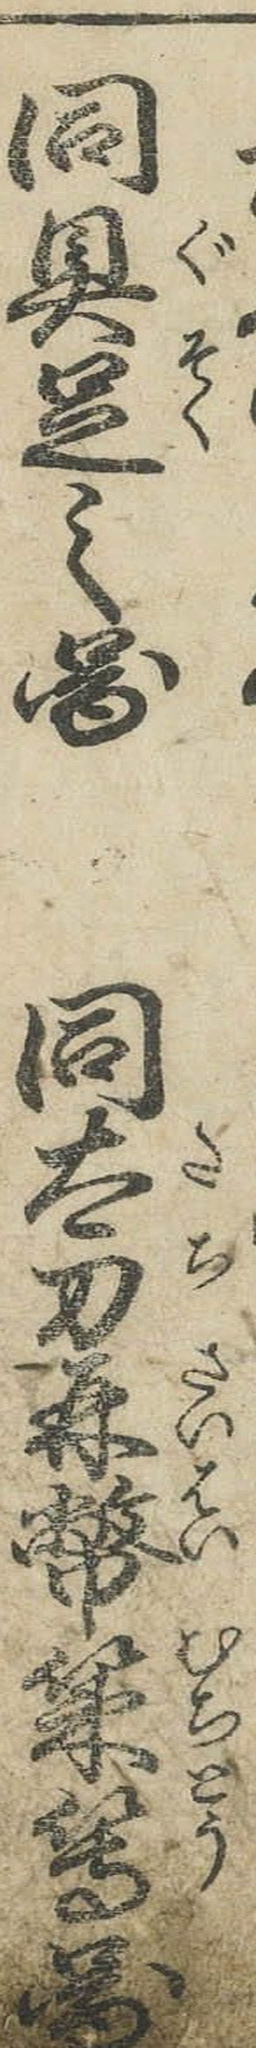同具足之図同太刀再幣策等図
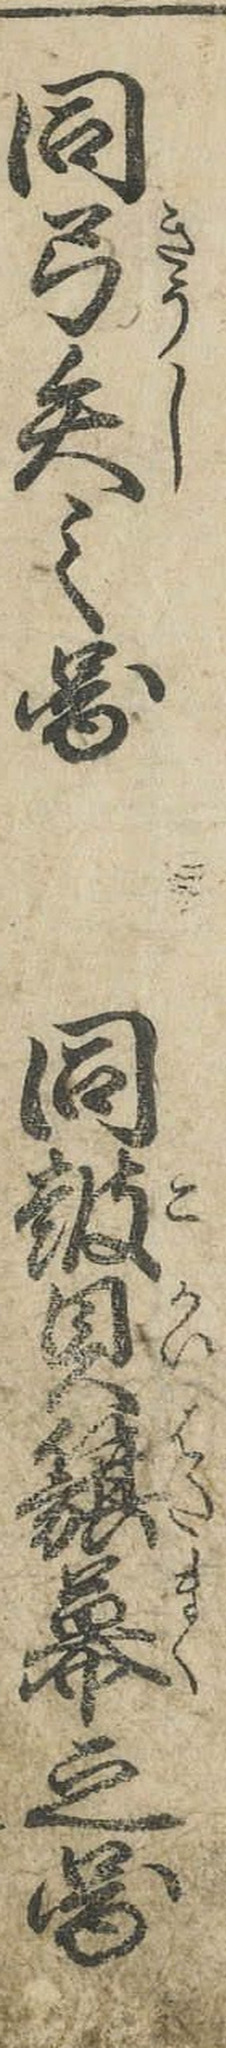同弓矢之図同鼓貝旗幕之図

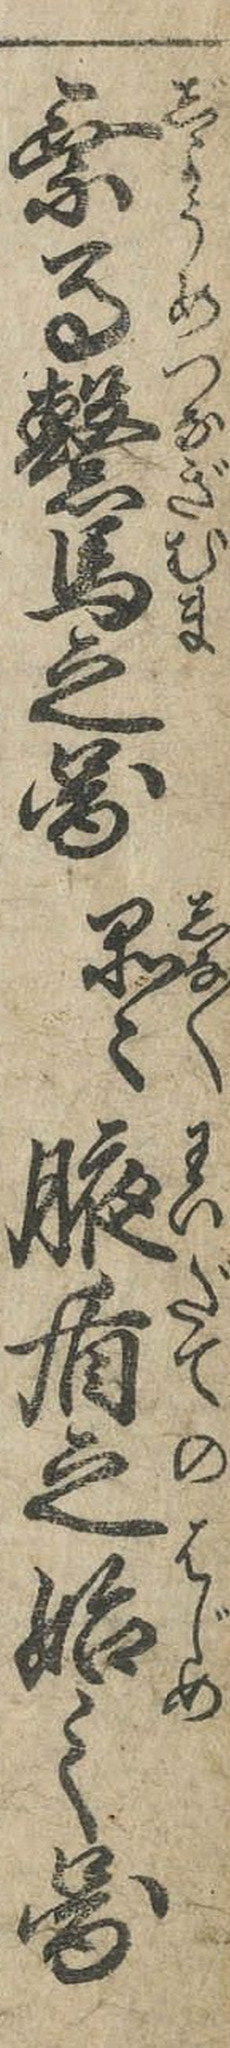乗馬繋馬之図品々腋楯之始之図
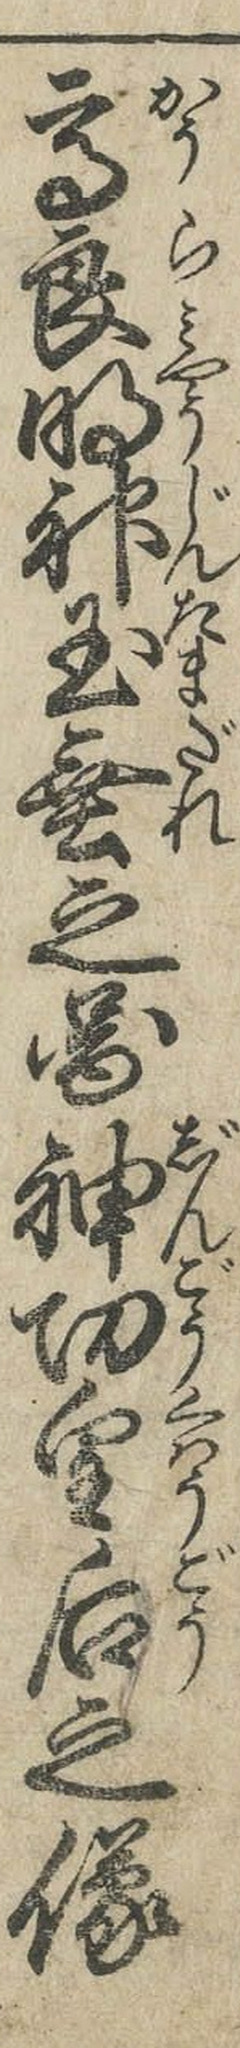高良明神玉垂之図神功皇后之像
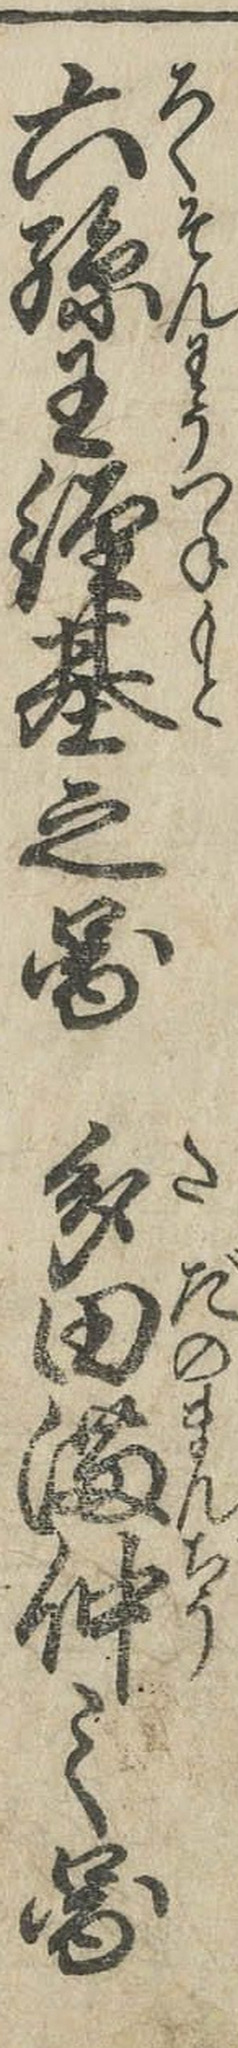六孫王経基之図多田満仲之図
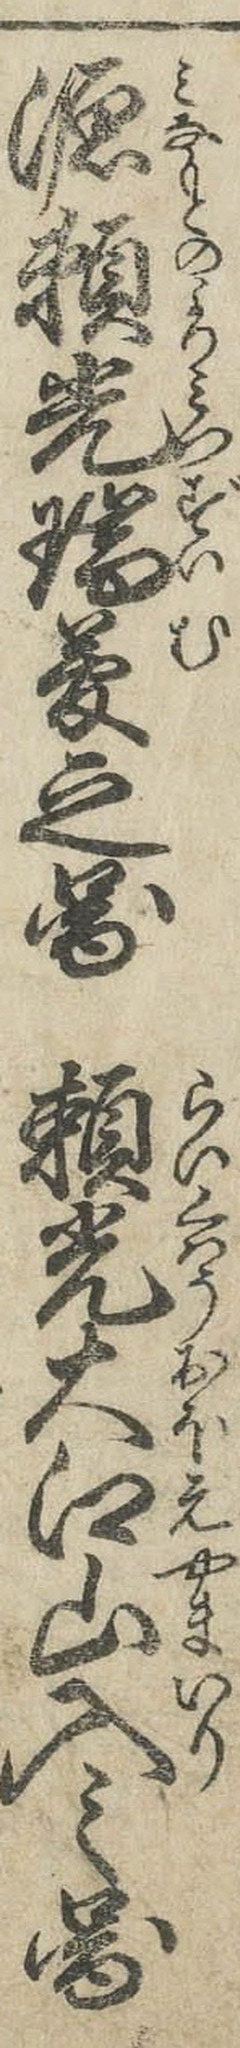源頼光瑞夢の図頼光大江山入之図
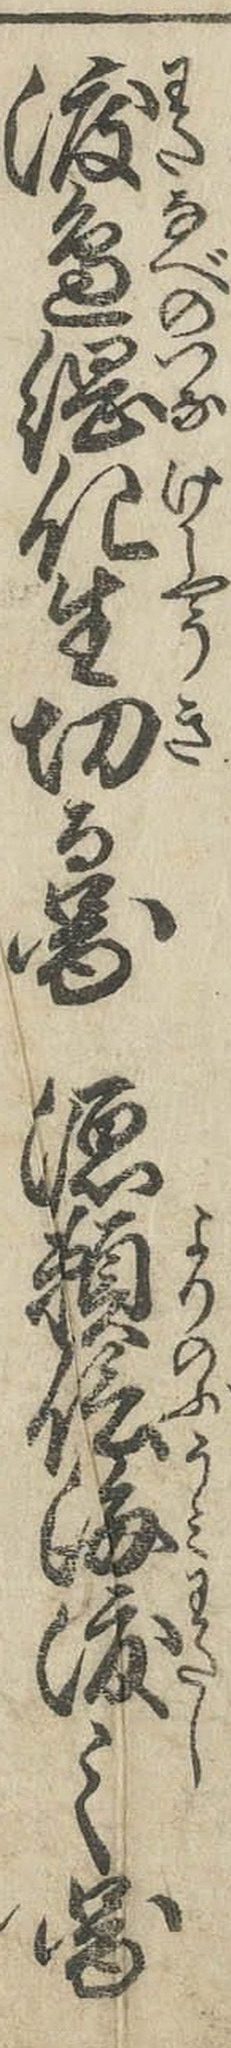渡辺綱化生切る図源頼信海渡之図
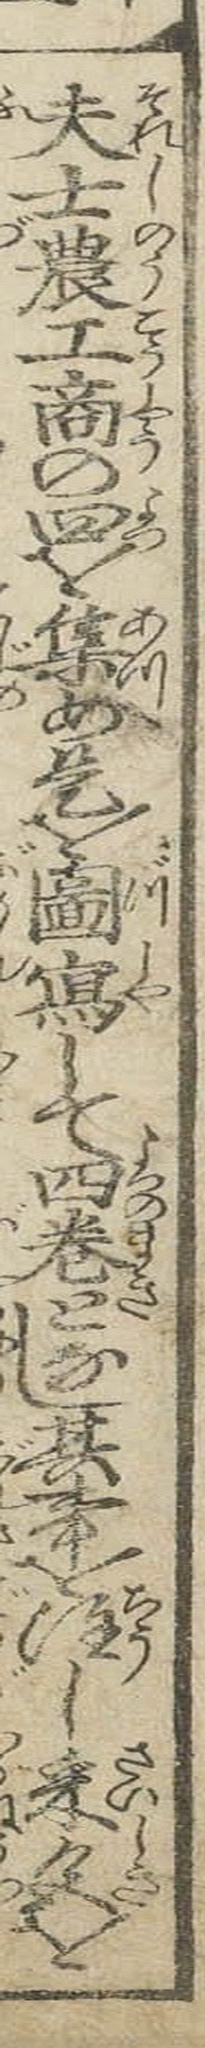夫士農工商の四を集め是を図写して四巻となし其事を注し采色を
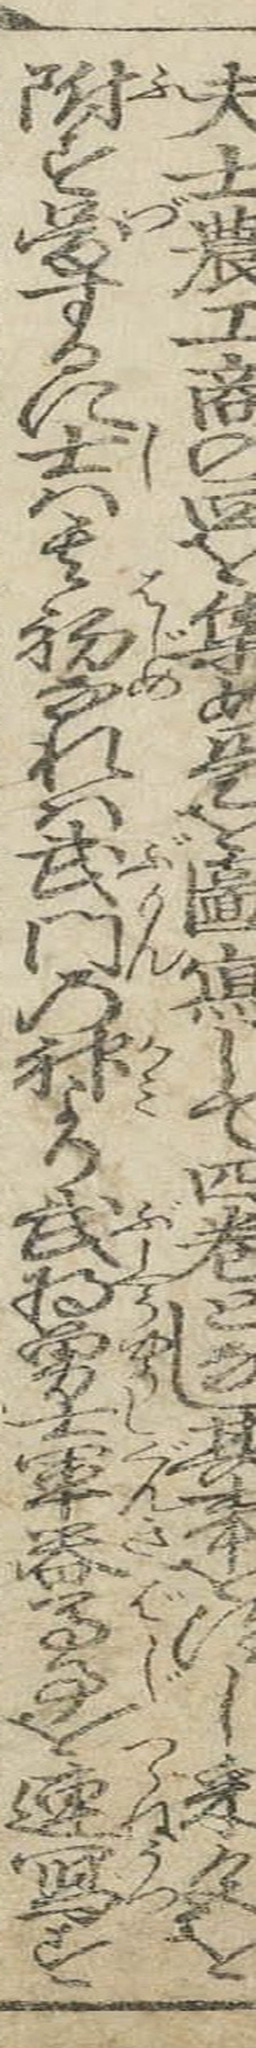付す図するに士は其初なれは武門の神より武将勇士軍器馬事を連写す
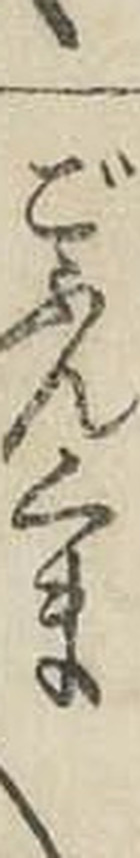ごふんくま
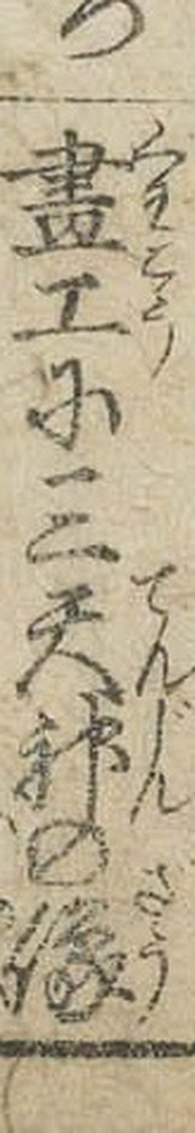画工に三天神の像
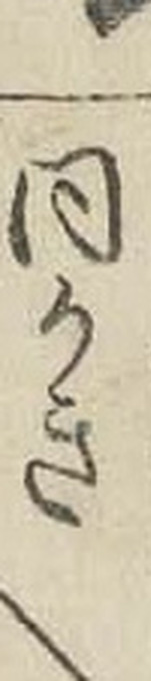同かき
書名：絵本写宝袋 9巻 2之巻
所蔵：東京学芸大学教育コンテンツアーカイブ
